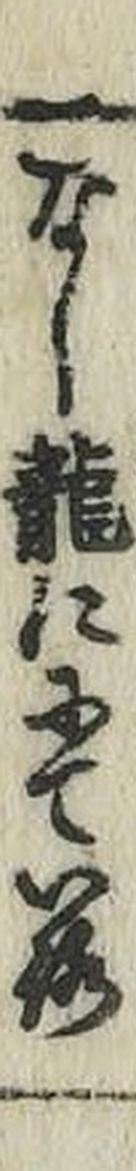なし龍ににていろ
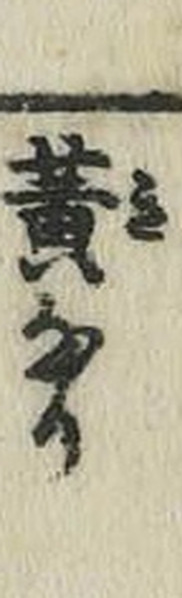黄なり
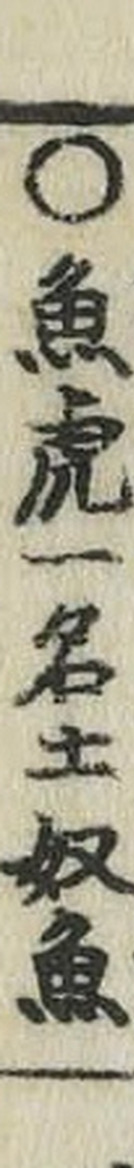○魚虎一名土奴魚
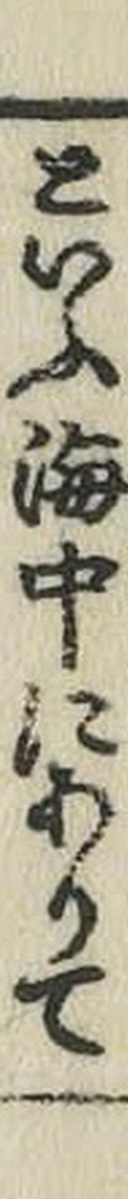といふ海中にありて
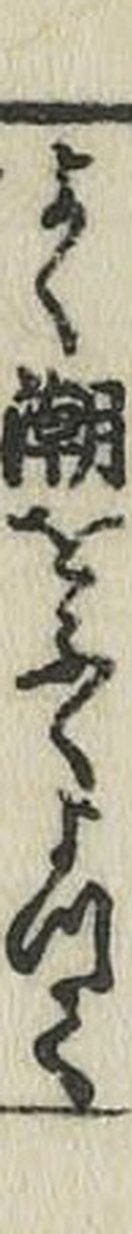よく潮をふくよつて
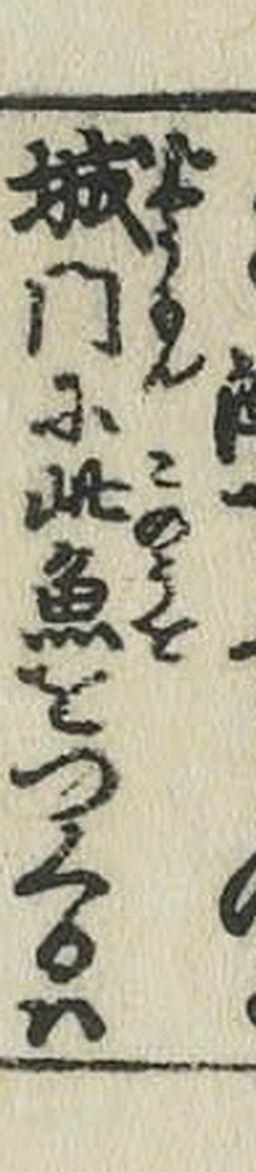城門に此魚をつくるは
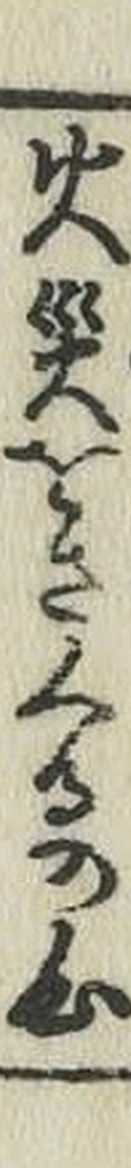火災をさへるの心
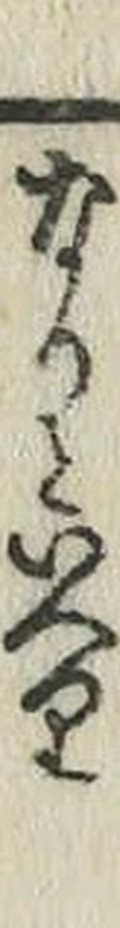なりといへり
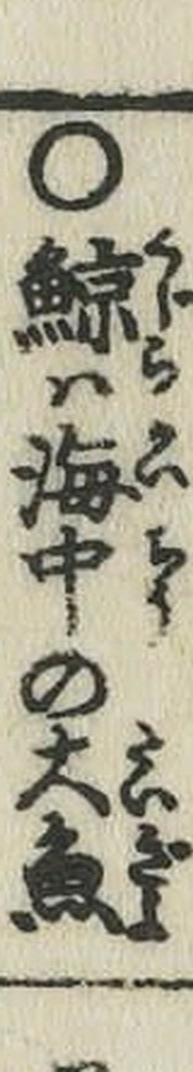○鯨は海中の大魚
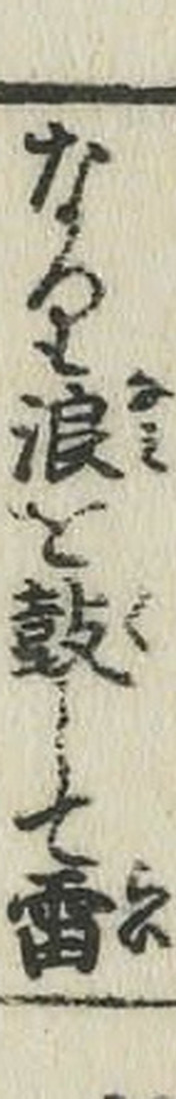なり浪を鼓して雷
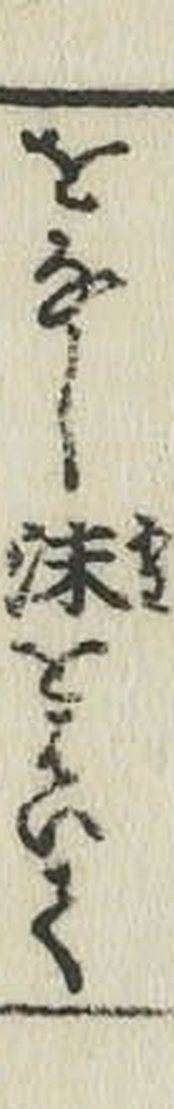をなし沫をはいて
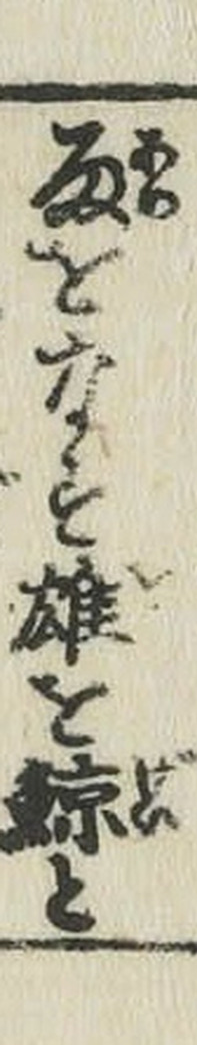雨をなす雄を鯨と
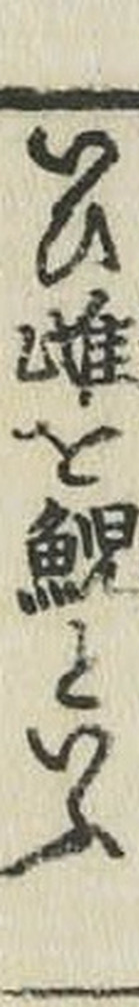いひ雌を鯢といふ
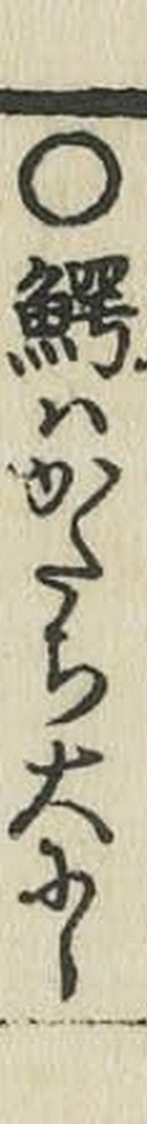○鰐はかたち大にし
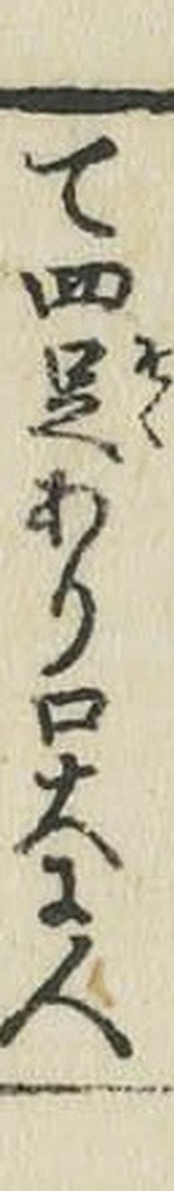て四足あり口大に人
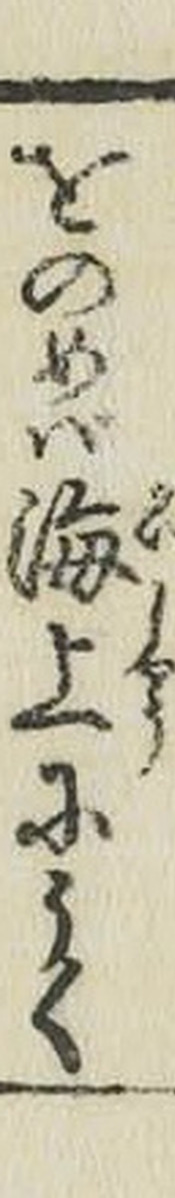をのめば海上にうく
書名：増補頭書訓蒙図彙大成 10巻 7:巻之14-16
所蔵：東京学芸大学教育コンテンツアーカイブ
